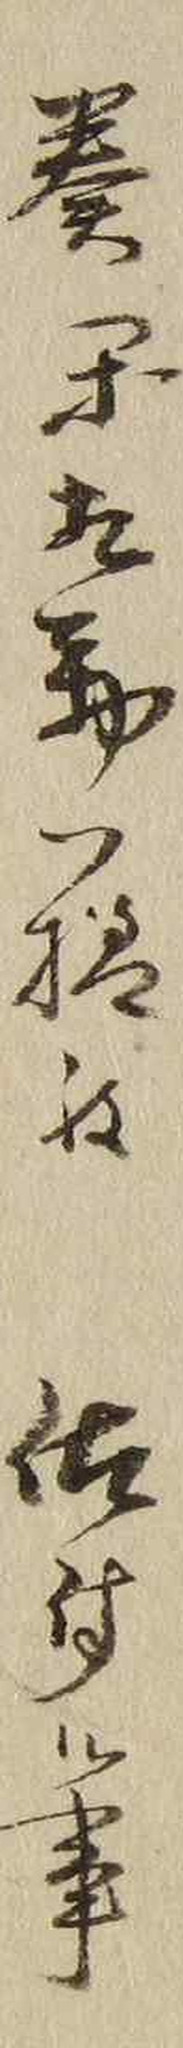奏楽相勤候様被仰付候事
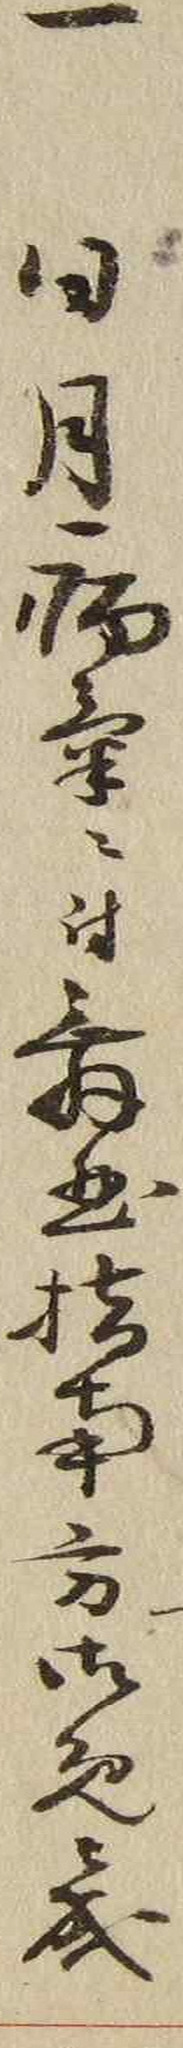一同月病気ニ付舞曲指南方御免被成
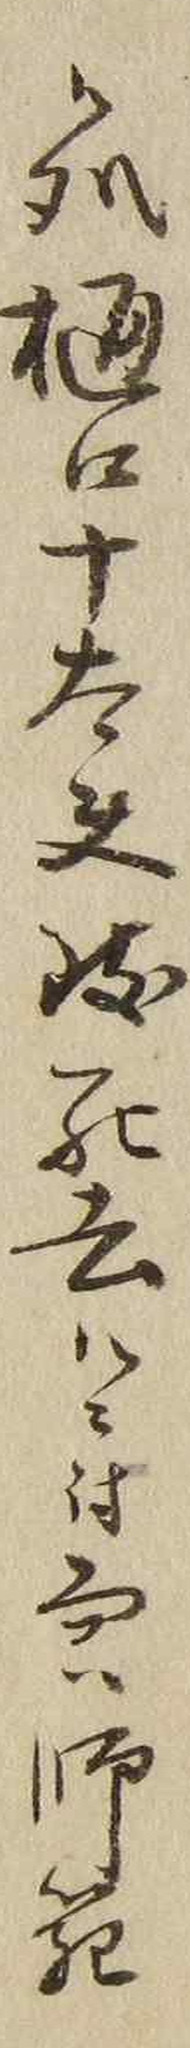候処樋口十太夫致死去候ニ付而ハ師範

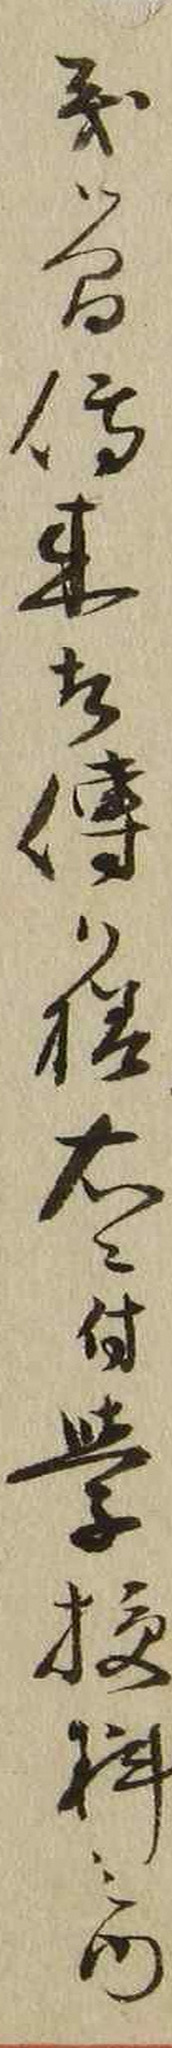義候間伝来相伝候様右ニ付学校料之内
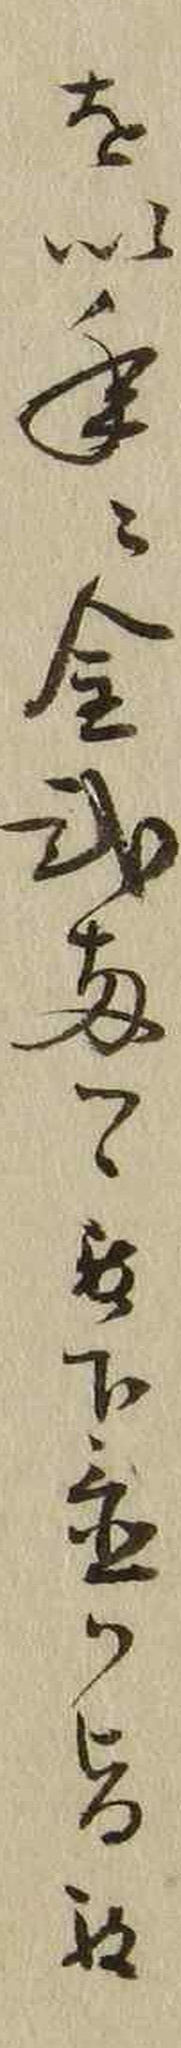を以手ニ金弐両ツヽ被下置候旨被
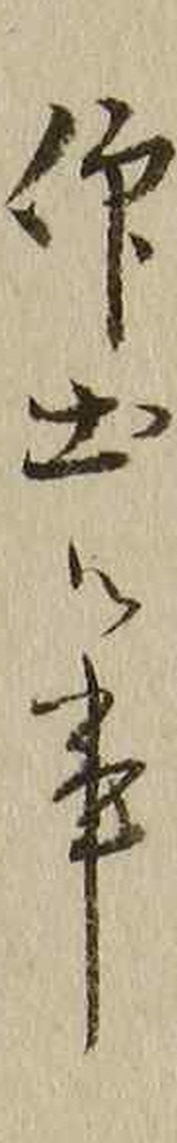仰出候事
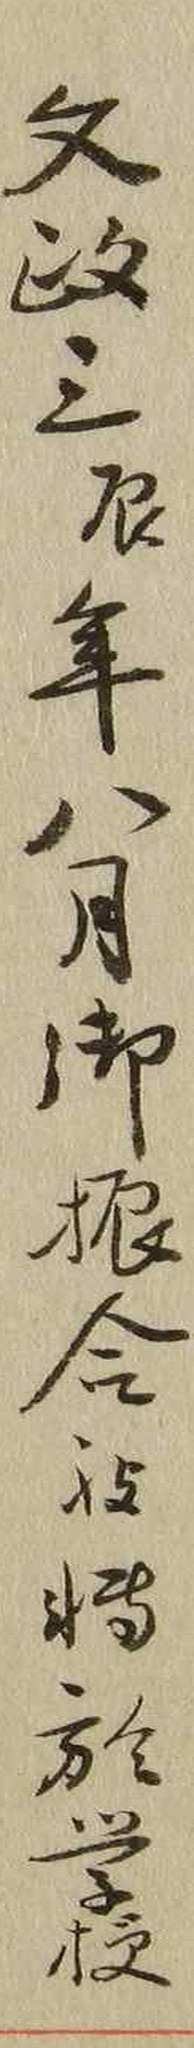一文政三辰年八月御振合被転於学校
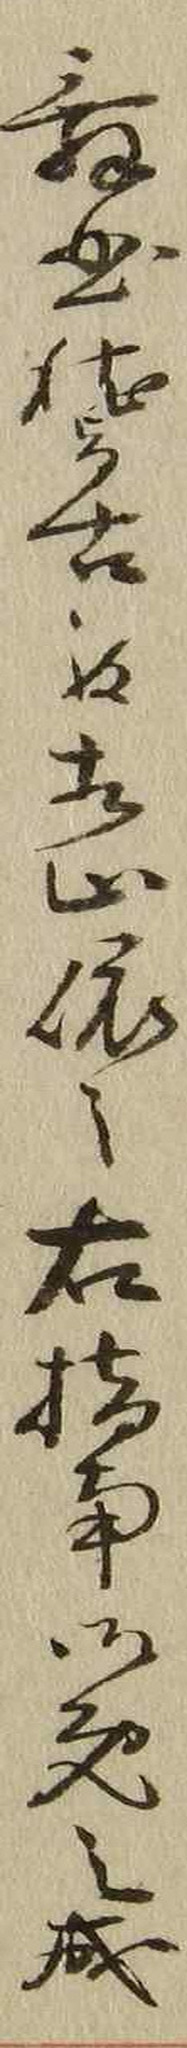舞曲稽古被相止依之右指南御免被成
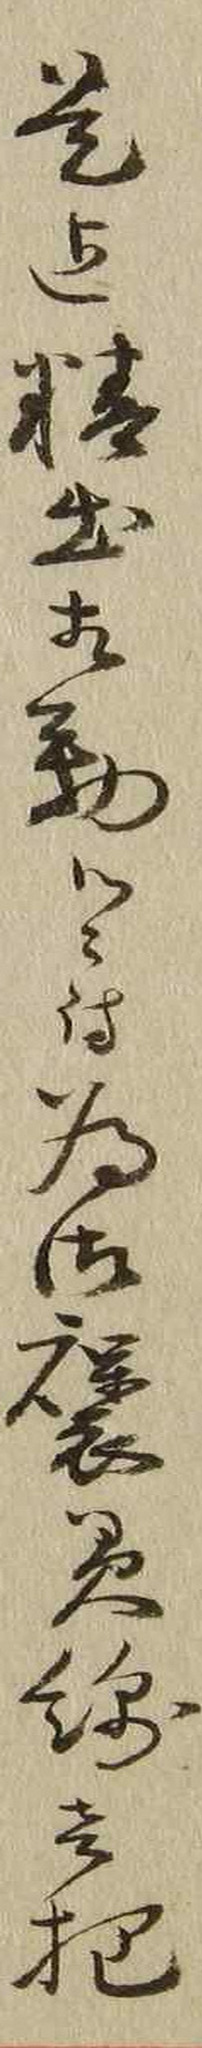是迄精出相勤候ニ付為御褒美綿壱把
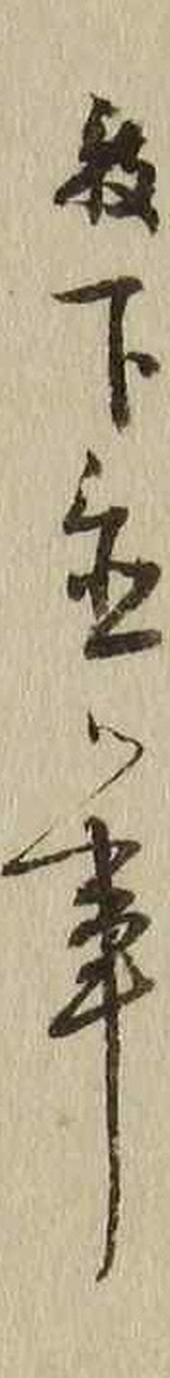被下置候事
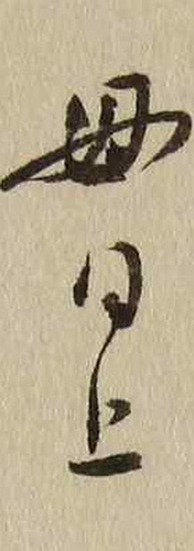母同上
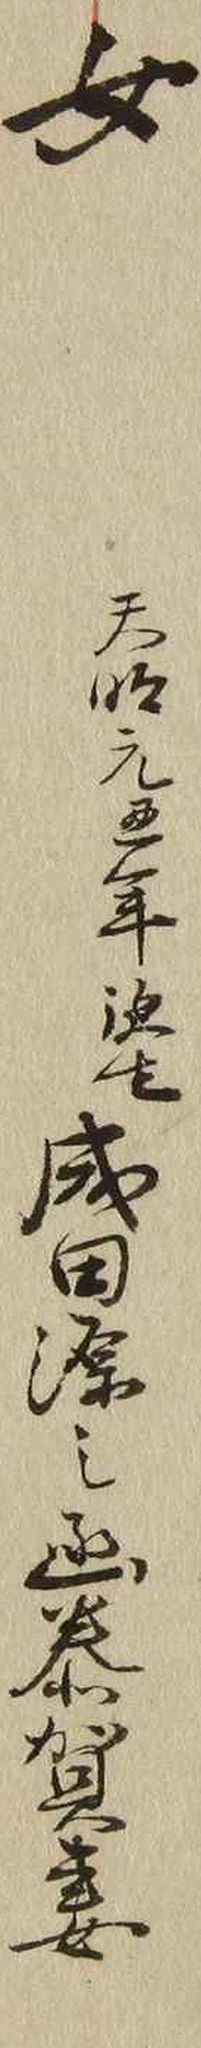女天明元丑年誕生成田源之丞泰賀妻
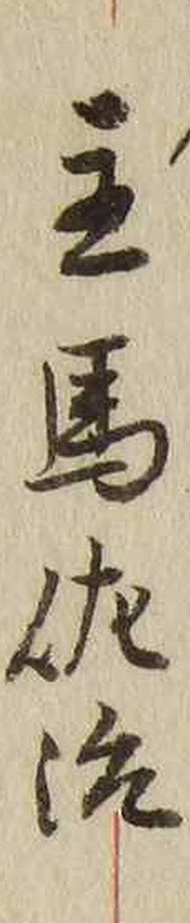主馬佐治
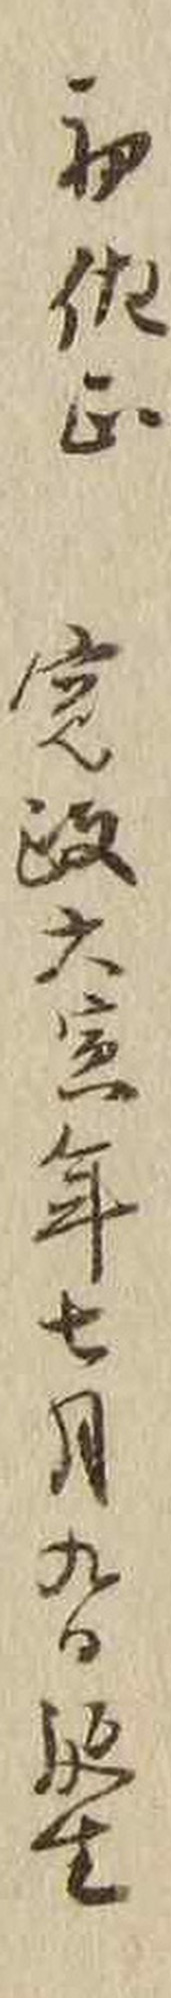初佐正寛政録六寅年七月九日誕生
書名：諸士系譜　巻之221　ま之部2
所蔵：会津若松市立会津図書館
